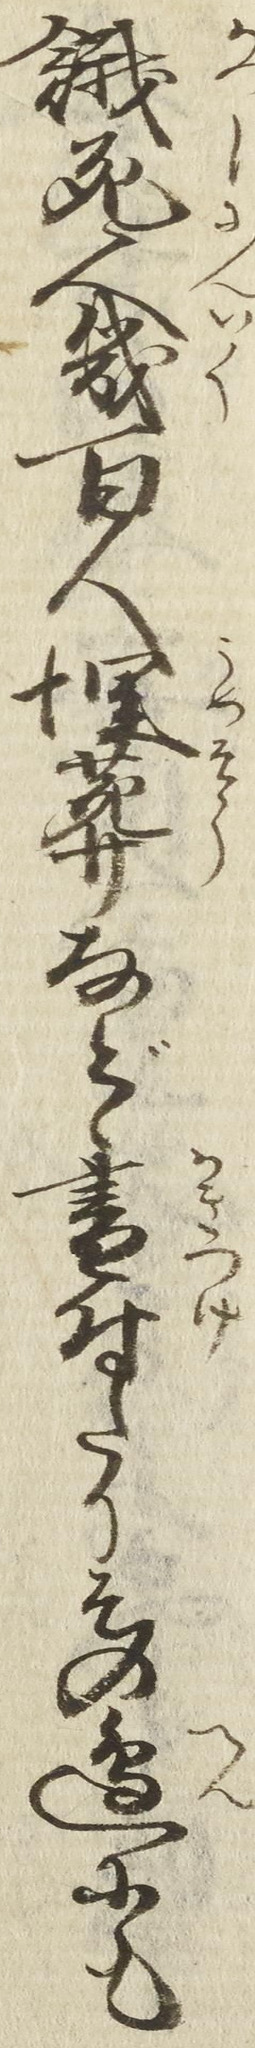餓死人幾百人埋葬などゝ書付たりその辺にも
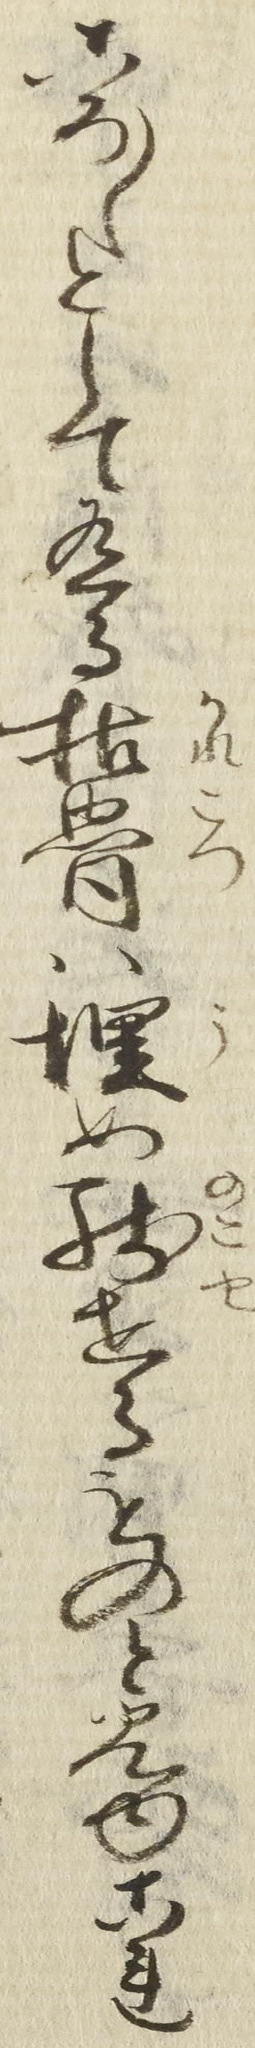ころ〳〵として有る枯骨は埋め残せるものと見ゆこれ
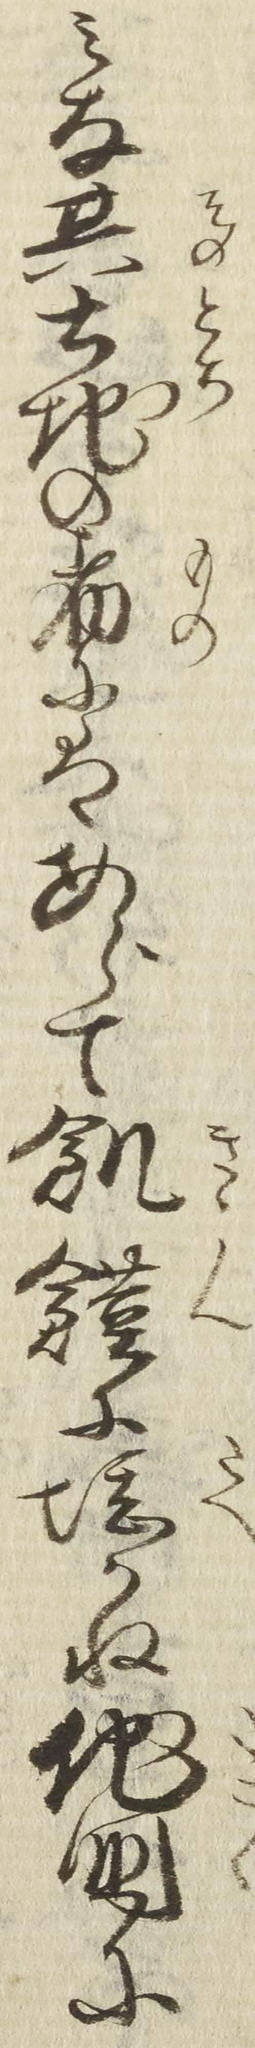みな其土地の者にはあらて飢饉に堪かね他国に
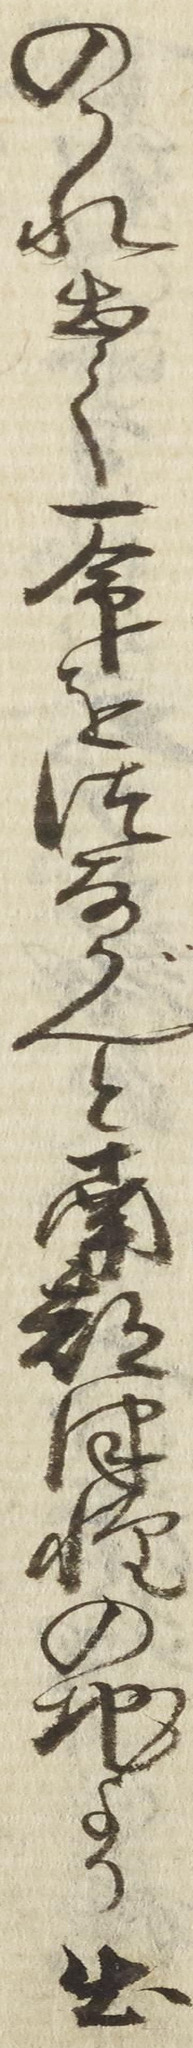のかれ出て一命をつながんと南部津軽の地より出
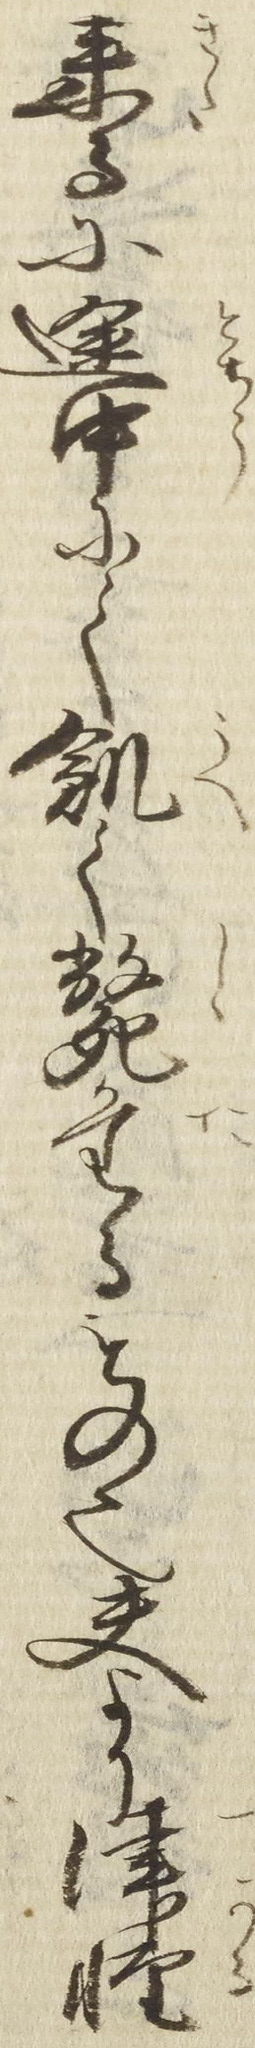来るに途中にて飢て斃たるもの也夫より津軽
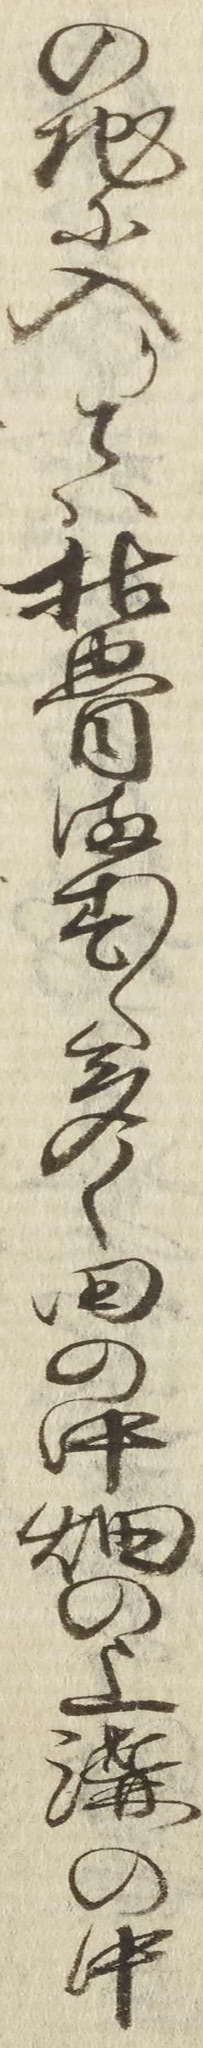の地に入りては枯骨ます〳〵多く田の中畑の上溝の中
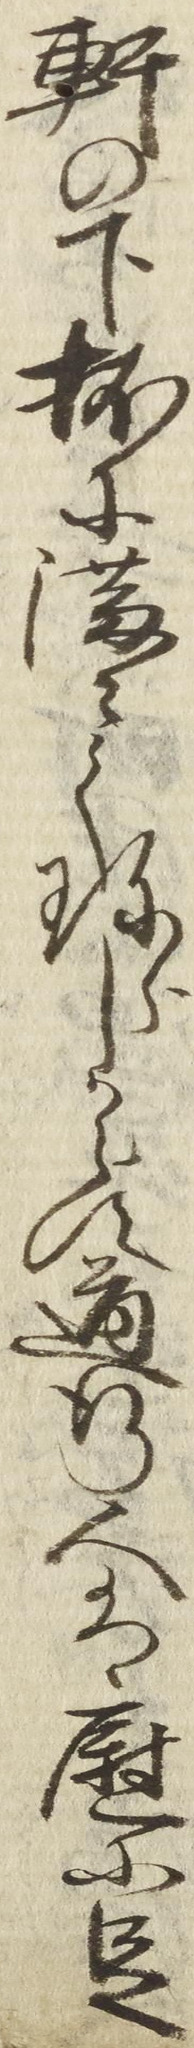軒の下抔に満〻て珍らしからす通行人は慰に足
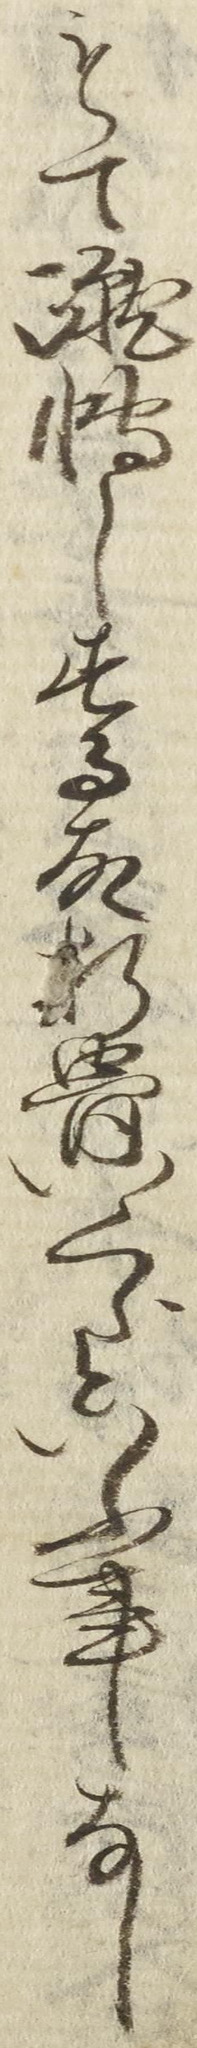もて蹴転しする故折骨いくらといふ事なし

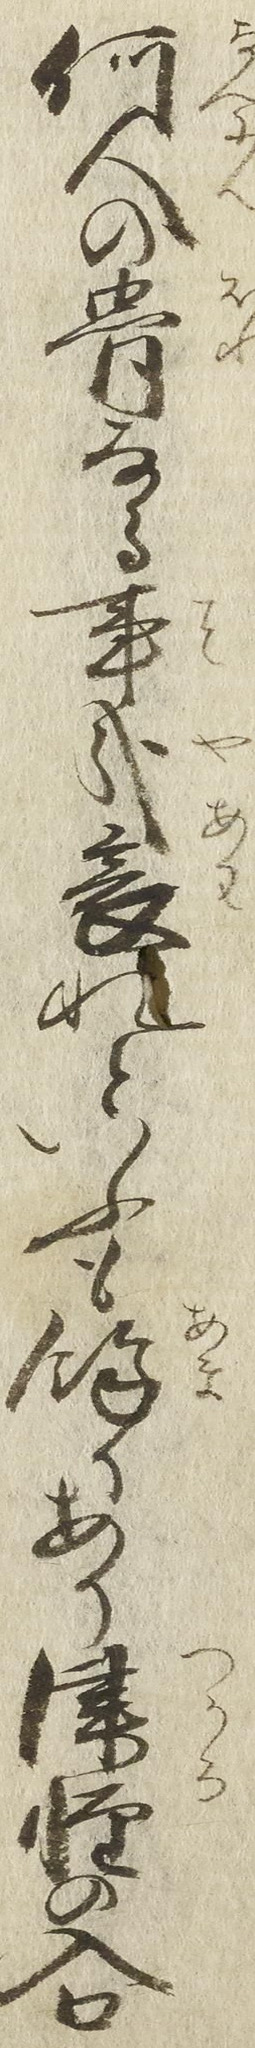何人の骨なる事哉哀れといふも余りあり津軽の入口
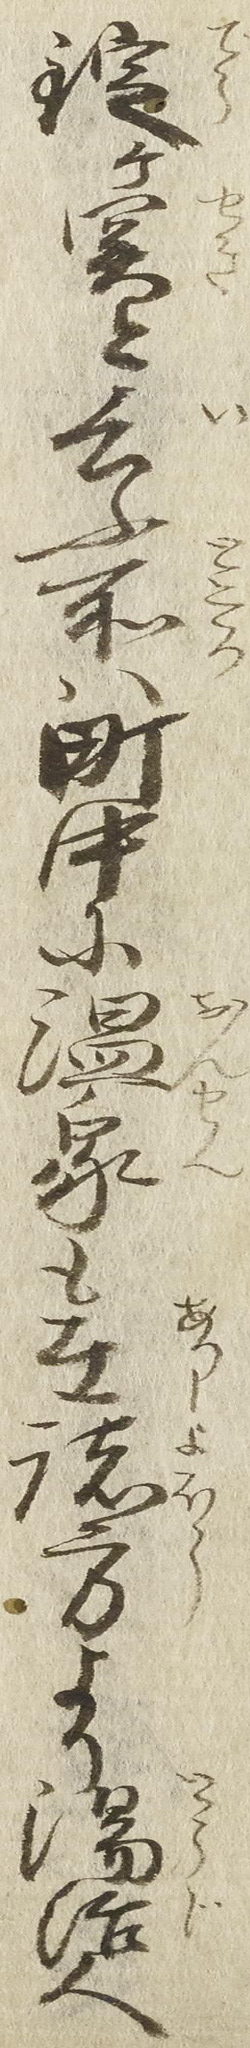錠ケ関と云ふ所は町中に温泉も在諸方より湯治人
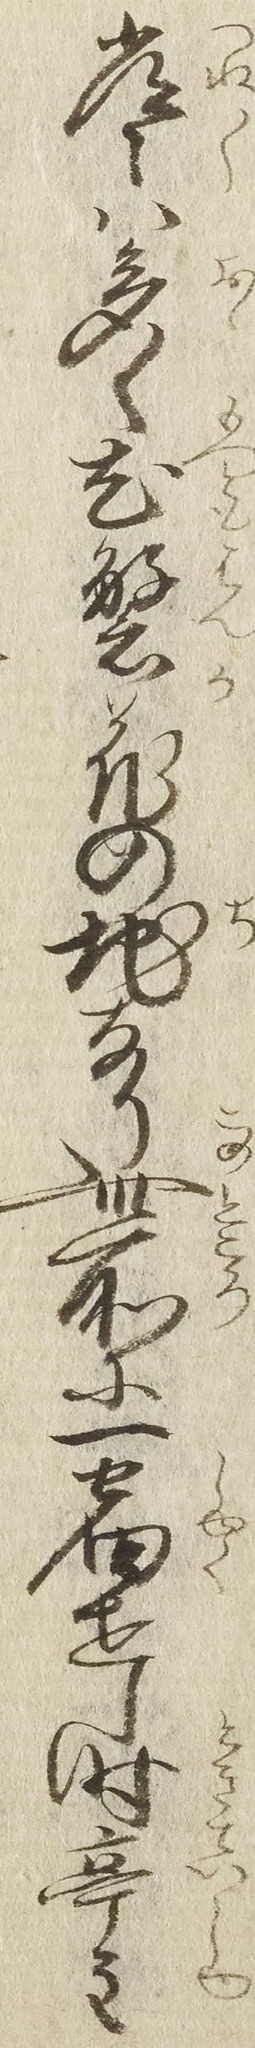常〻は多く尤繁花の地なり此所に一宿せし時亭主
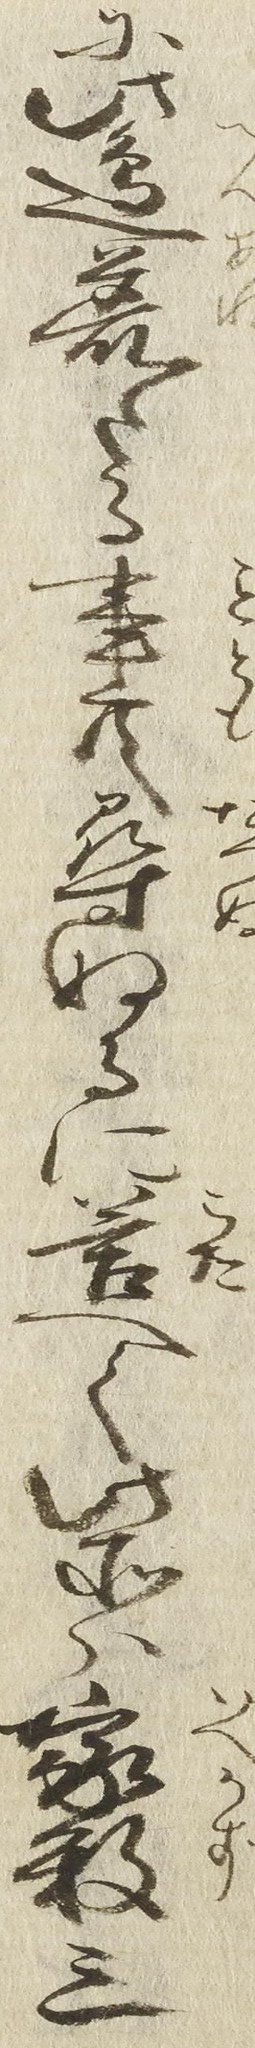に此辺荒たる事共尋ぬるに答へて此所は家数三
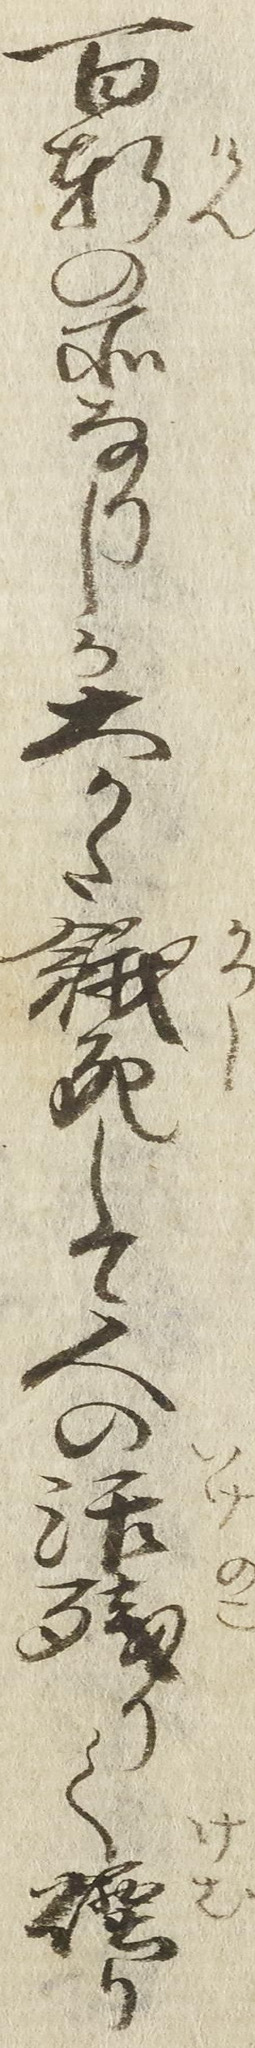百軒の所なりしか大かた餓死して人の活残りて煙り
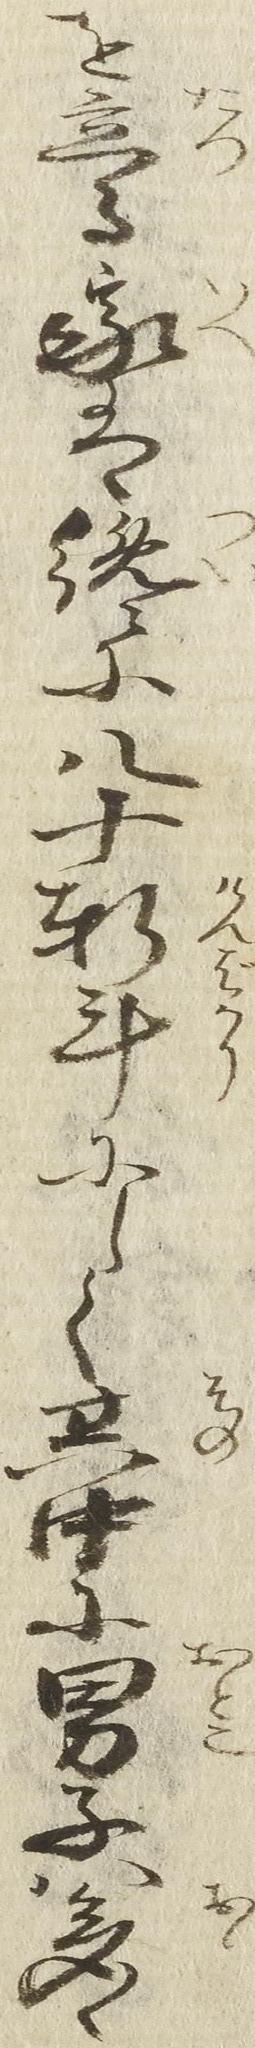を立る家は終に八十軒斗にして其中に男子は多く
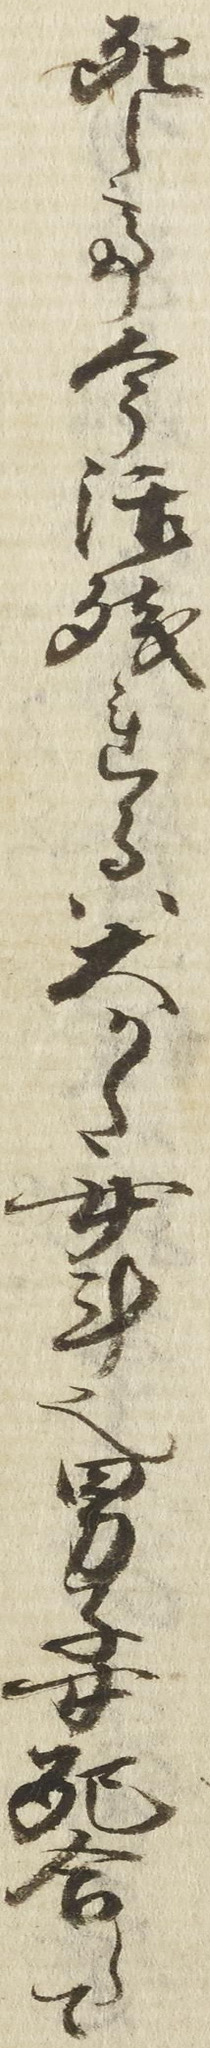死して今活残れるは大かた女斗也男子女配合して
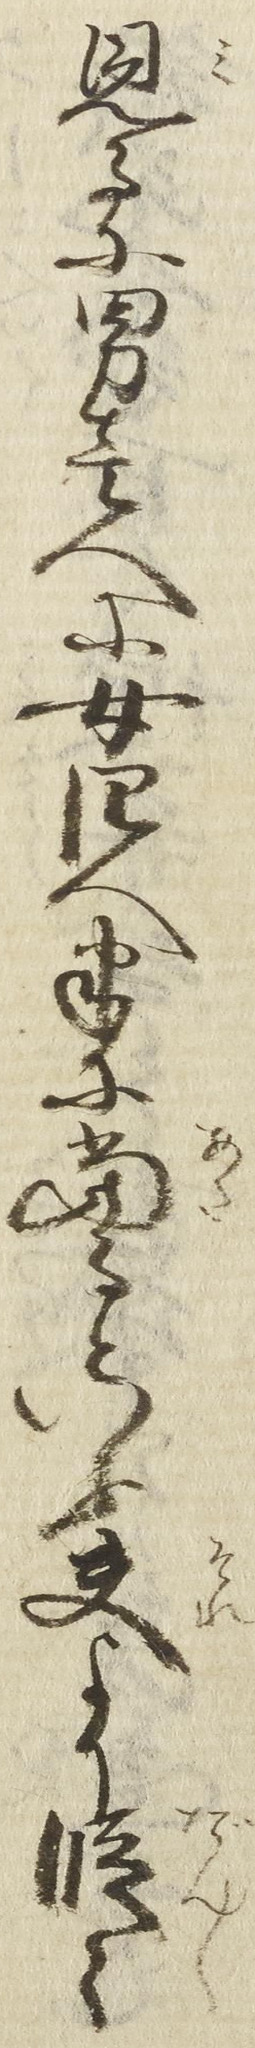見るに男壱人に女四人半に当るといふ夫より段〻
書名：天明奇畧　全
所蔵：東京大学地震研究所図書室 Earthquake Research Institute Library, The University of Tokyo, JAPAN
